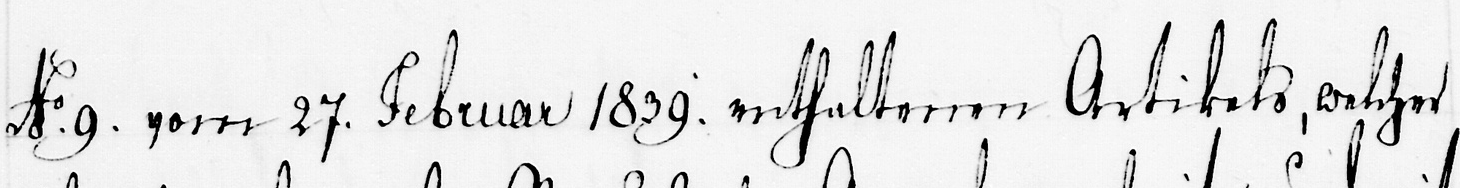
No. 9. vom 27. Februar 1839. enthaltenen Artikels, welcher
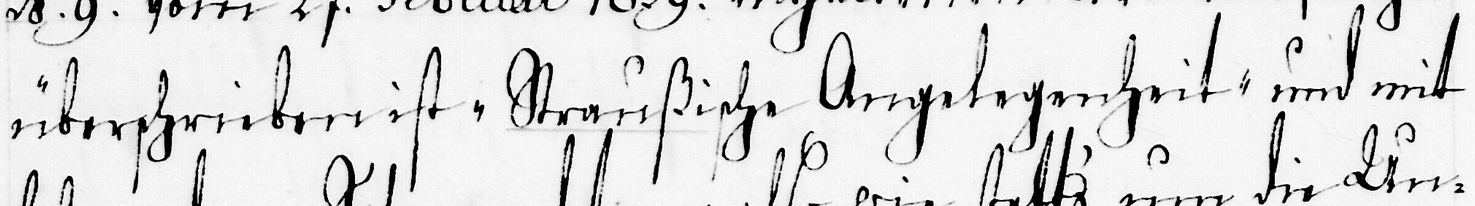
überschrieben ist „Straußische Angelegenheit“ und mit
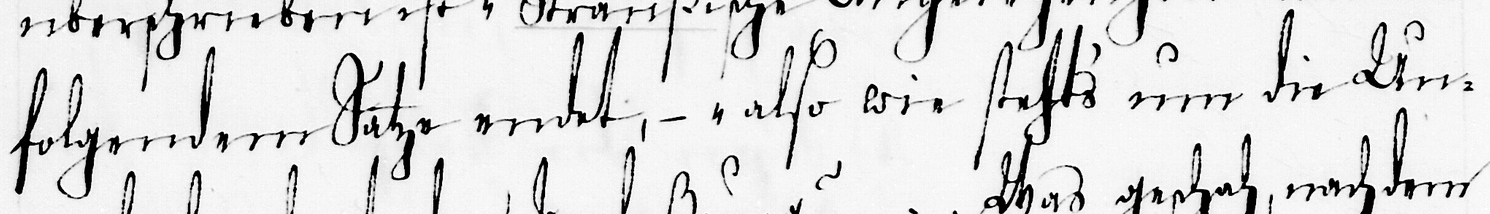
folgendem Satze endet, – „also wie steht‘s um die Un¬
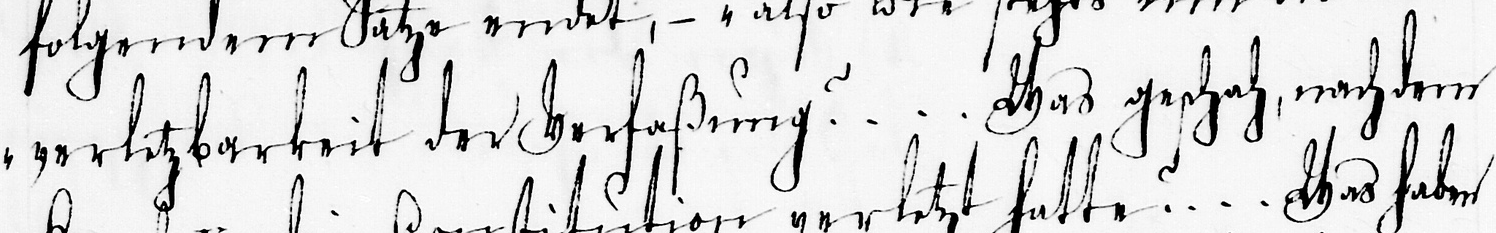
verletzbarkeit der Verfaßung? ... Was geschah, nachdem
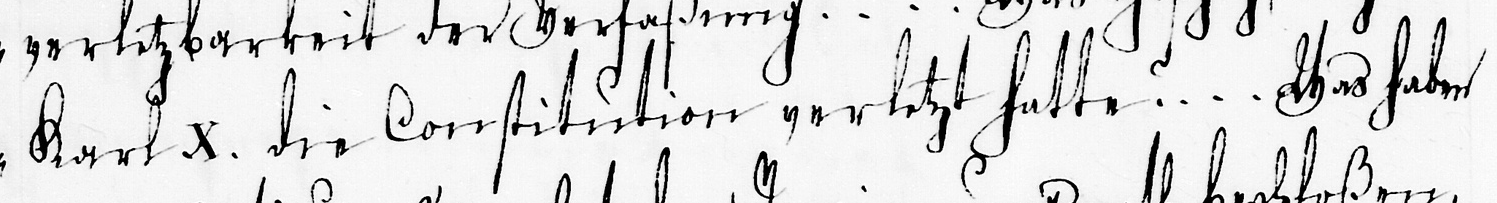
Karl X. die Constitution verletzt hatte? … Was haben
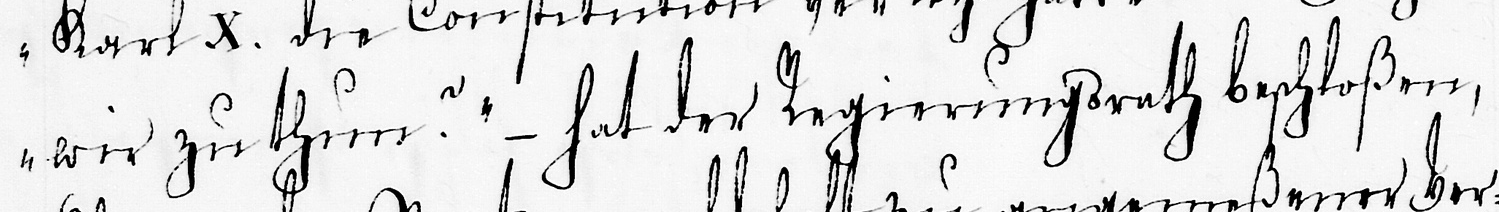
wir zu thun?“ – Hat der Regierungsrath beschloßen,
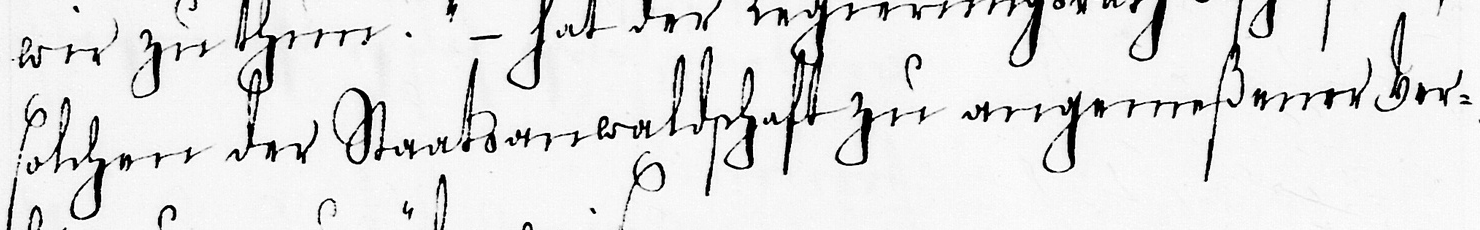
solchen der Staatsanwaldschaft zu angemeßener Ver¬
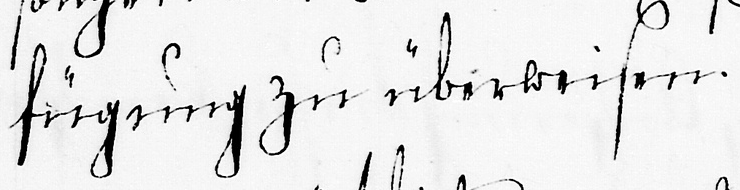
fügung zu überweisen.
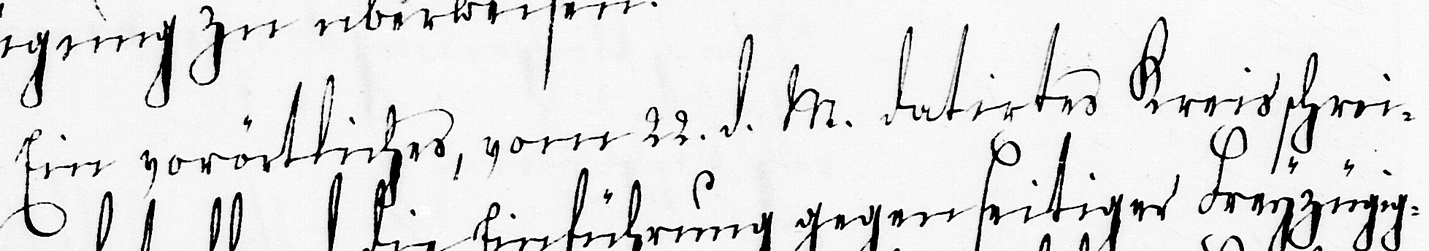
Ein vorörtliches, vom 22. d. M. datirtes Kreisschrei¬
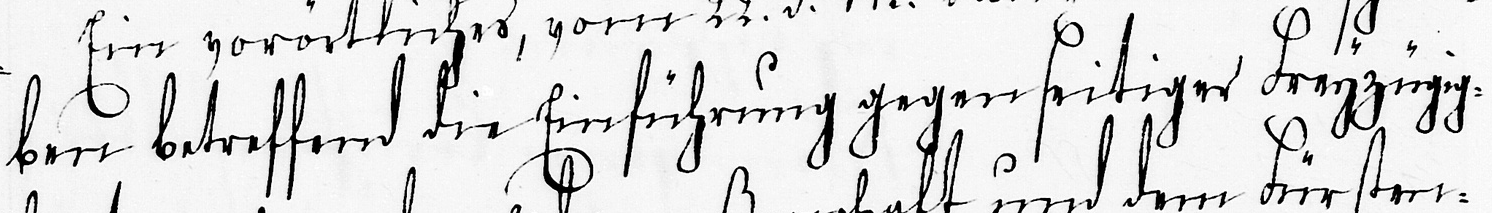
ben betreffend die Einführung gegenseitiger Freyzügig¬
